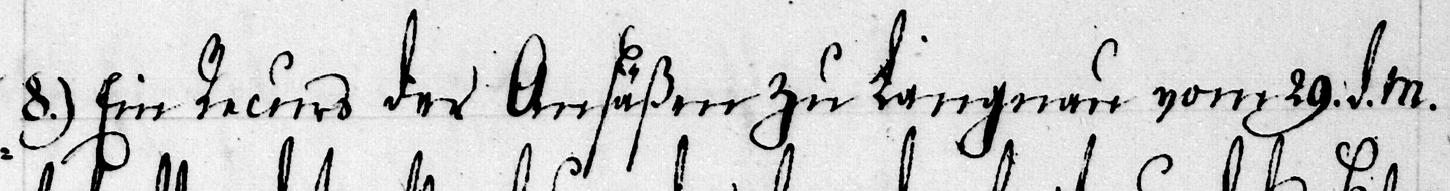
8.) Ein Recurs der Ansäßen zu Langnau vom 29. d. M.
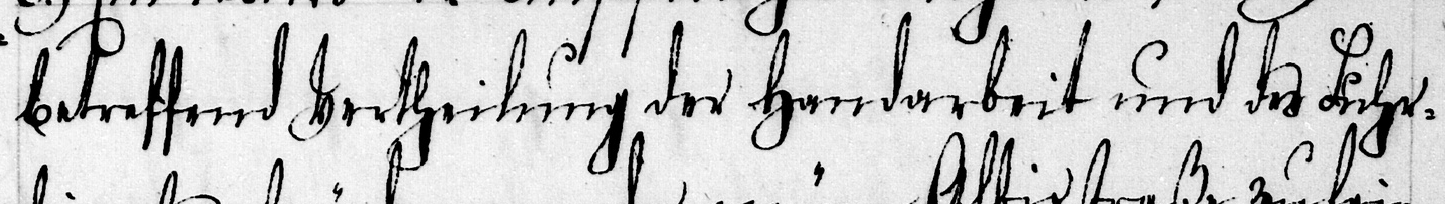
treffend Vertheilung der Handarbeit und des Fuhr¬
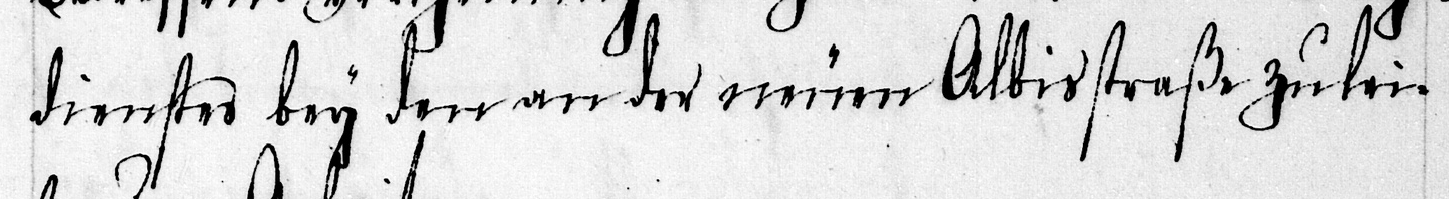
dienstes bey den an der neuen Albisstraße zu lei¬
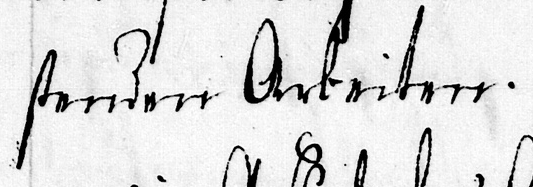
stenden Arbeiten.
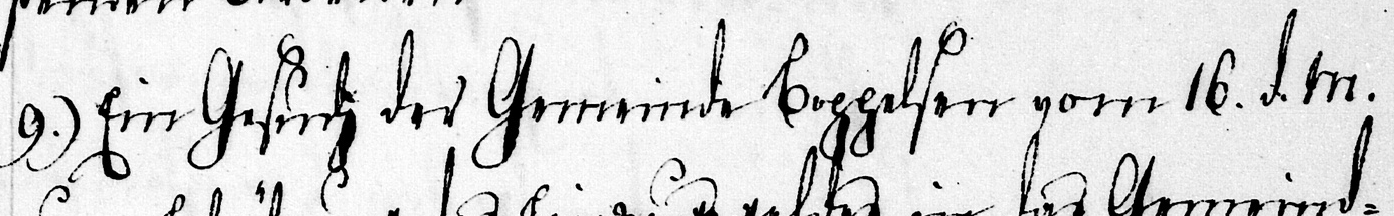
9.) Ein Gesuch der Gemeinde Boppelsen vom 16. d. M.
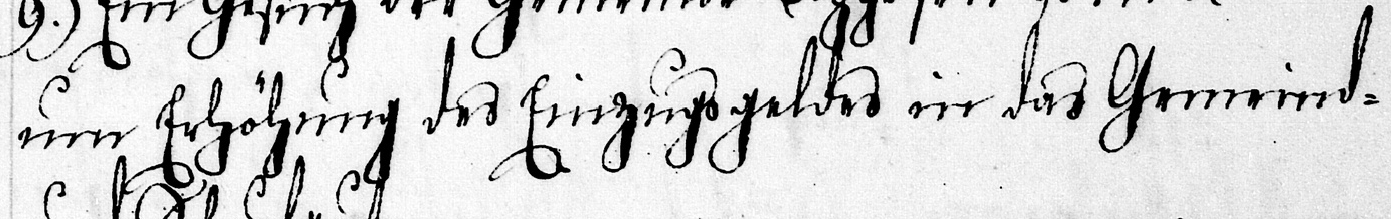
um Erhöhung des Einzugsgeldes in das Gemeind-
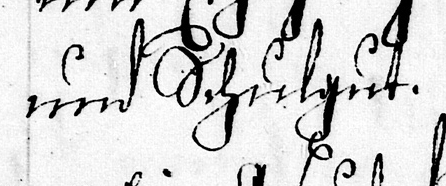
und Schulgut.
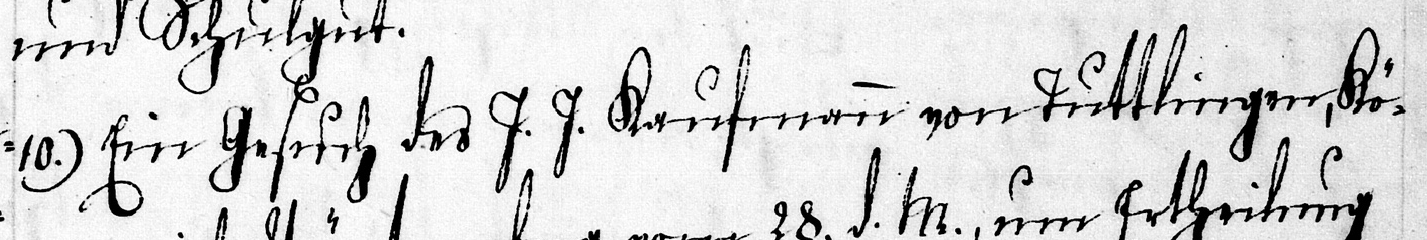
10.) Ein Gesuch des J. J. Kaufmann von Tuttlingen, Kö¬
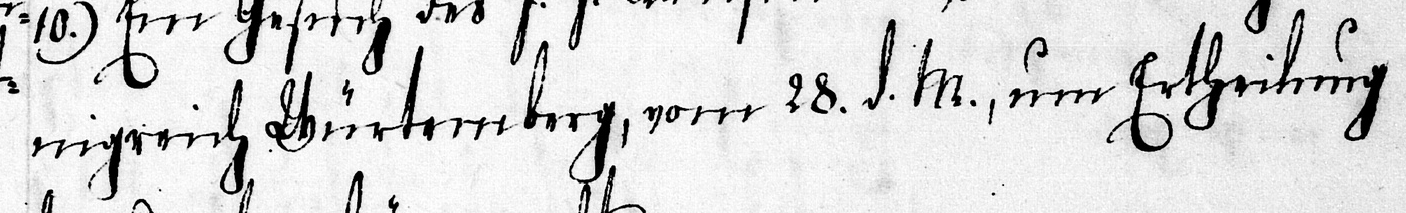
nigreich Würtemberg, vom 28. d. M., um Ertheilung
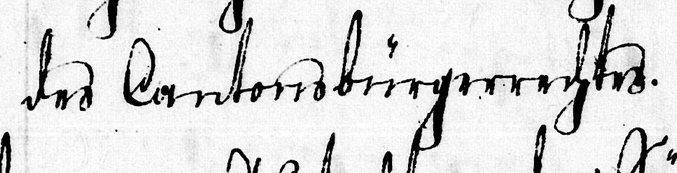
des Cantonsbürgerrechtes.
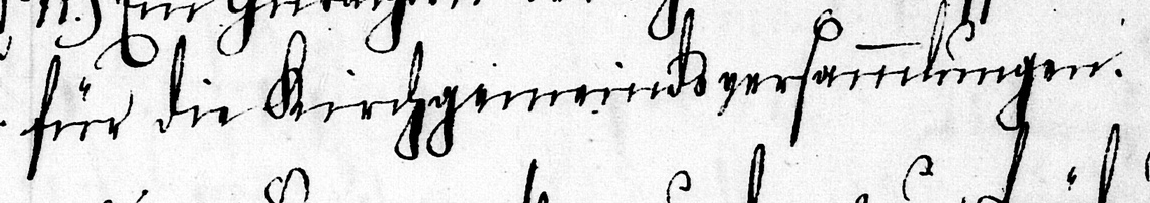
für die Kirchgemeindsversammlungen.
